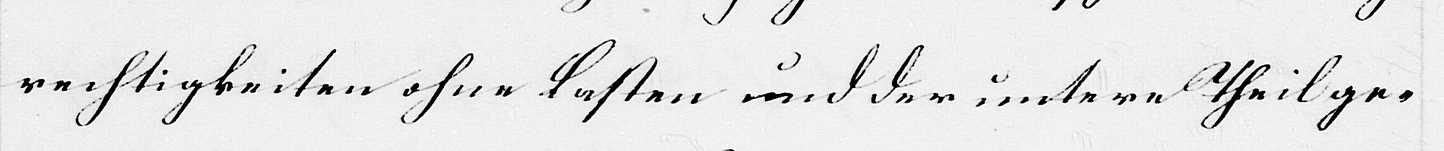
rechtigkeiten ohne Lasten und der unter Theil ge¬
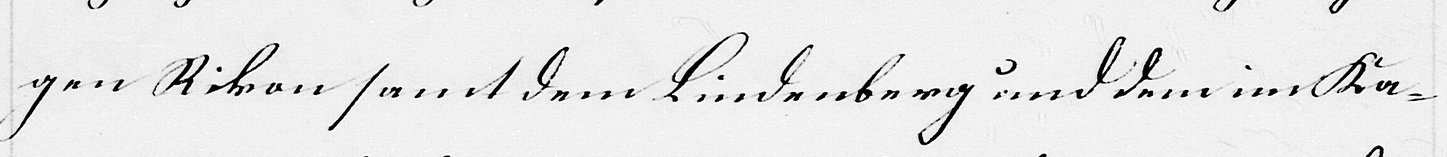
gen Rikon samt dem Lindenberg und dem im Ka¬
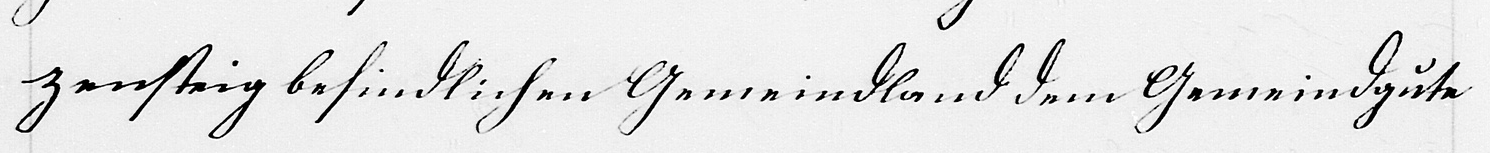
zensteig befindlichen Gemeindland dem Gemeindgute
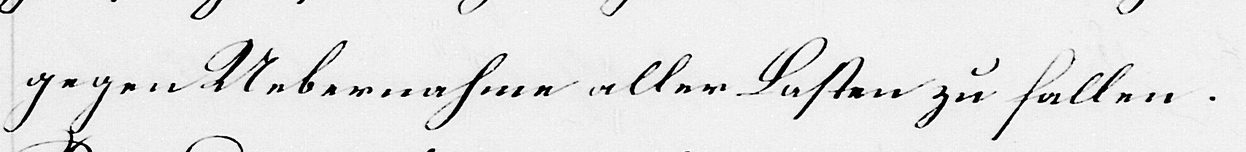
gegen Uebernahme aller Lasten zu fallen.
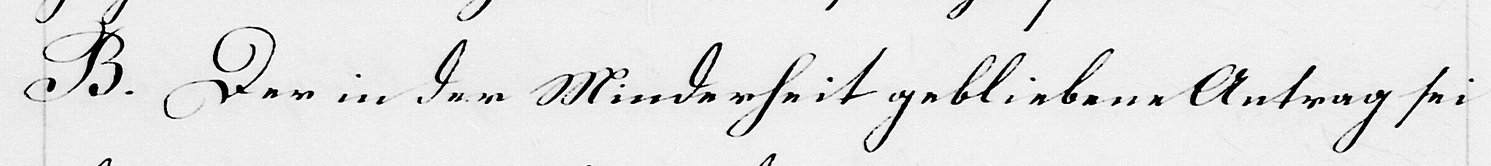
B. Der in der Minderheit gebliebene Antrag sei
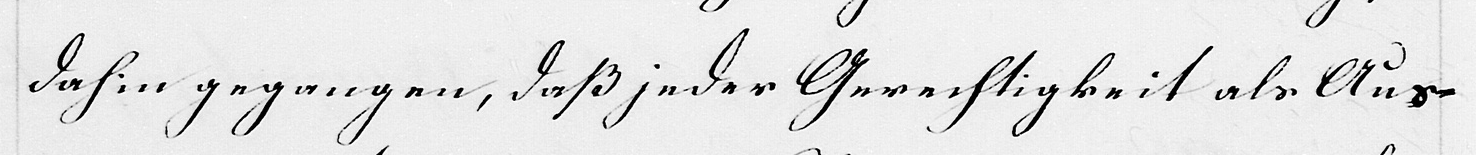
dahin gegangen, daß jeder Gerechtigkeit als Aus¬
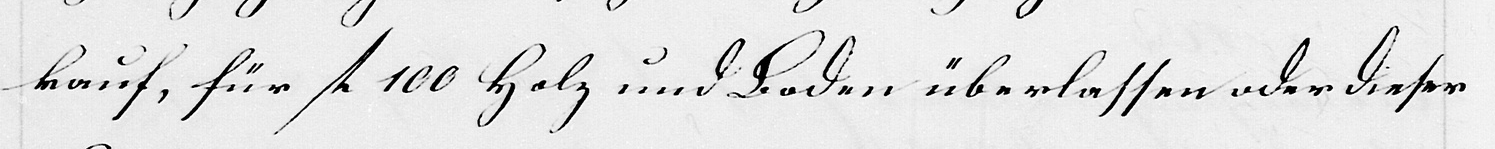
kauf, für fl 100 Holz und Boden überlassen oder dieser
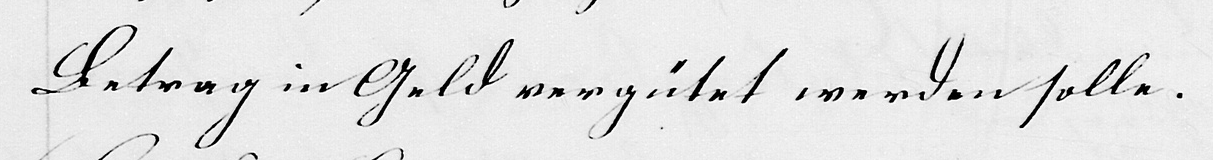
Betrag in Geld vergütet werden solle.
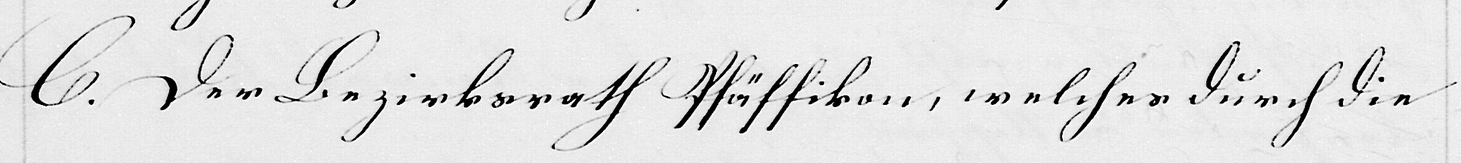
C. Der Bezirksrath Pfäffikon, welcher durch die
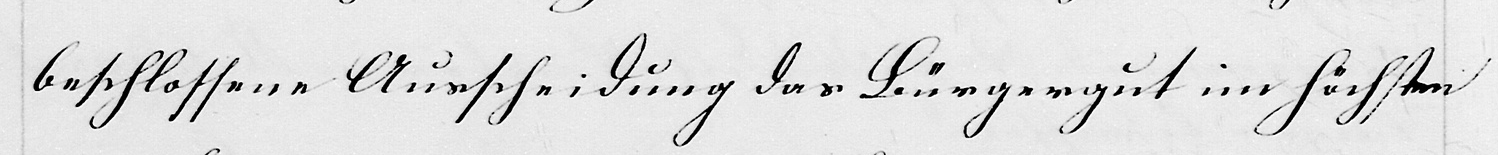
beschlossene Ausscheidung das Bürgergut im höchsten
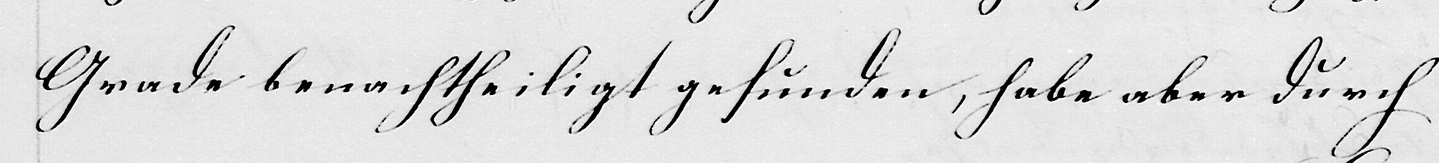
Grade benachtheiligt gefunden, habe aber durch
